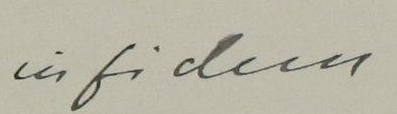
in fidem
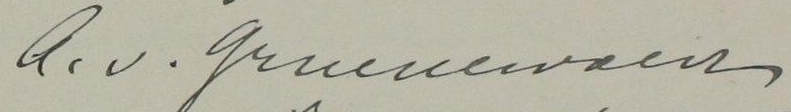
A. v. Gruenewaldt
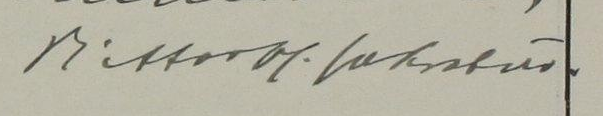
Rittersch.sekretär
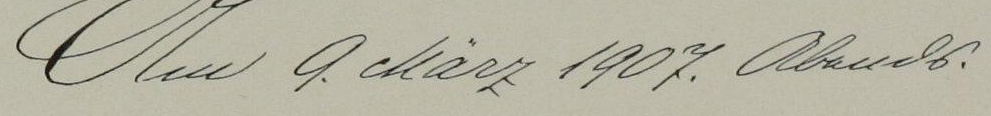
Am 9. März 1907. Abends.
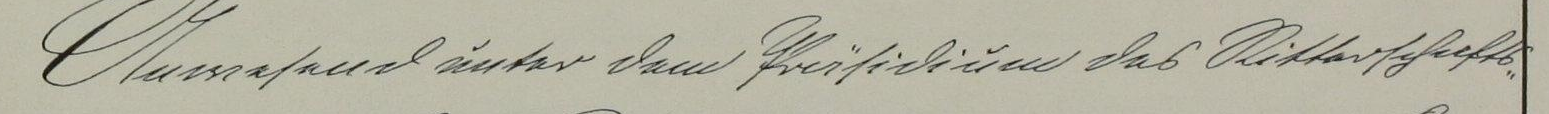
Anwesend unter dem Präsidium des Ritterschafts-
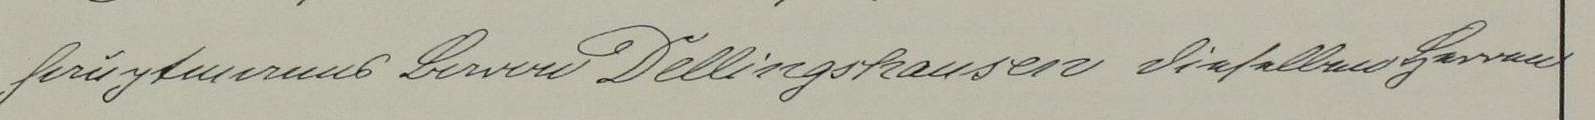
hauptmanns Baron Dellingshausen dieselben Herren
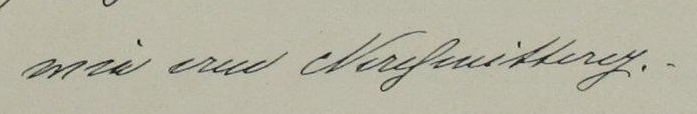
wie am Nachmittag.
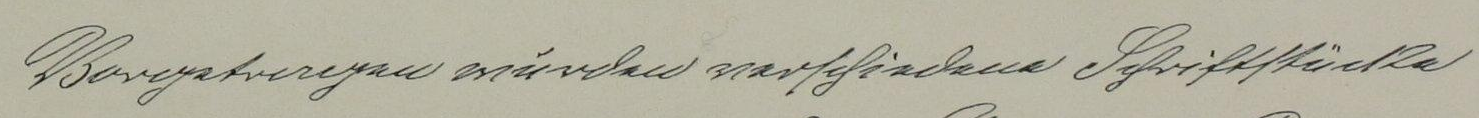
Vorgetragen wurden verschiedene Schriftstücke
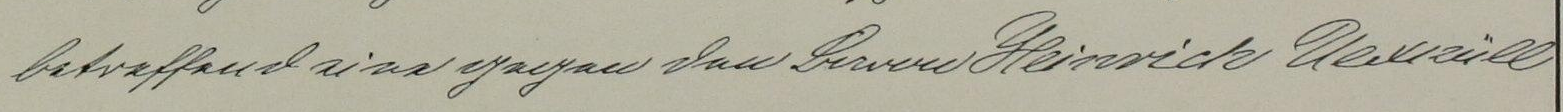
betreffend eine gegen den Baron Heinrich Uexküll
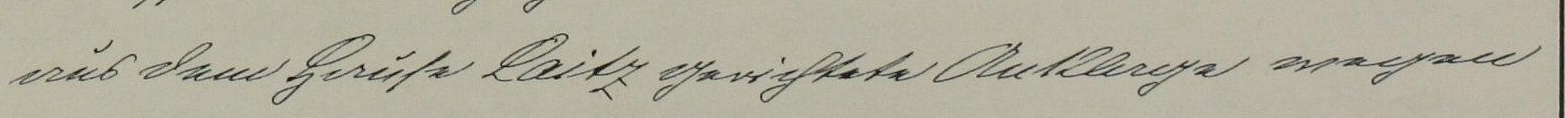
aus dem Hause Laitz gerichtete Anklage wegen
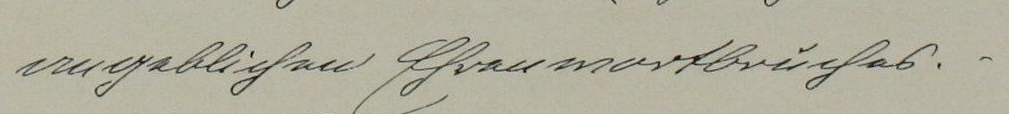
angeblichen Ehrenwortbruches.
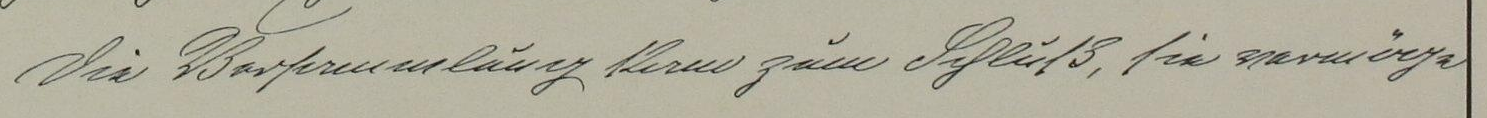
Die Versammlung kam zum Schluß, sie vermöge
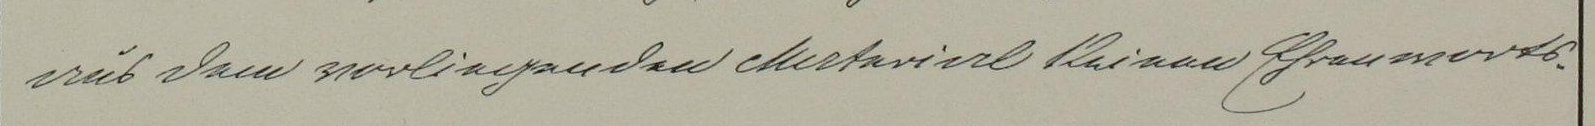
aus dem vorliegenden Material keinen Ehrenworts-
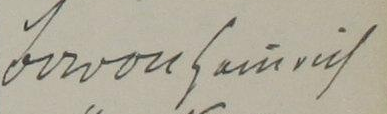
Baron Heinrich
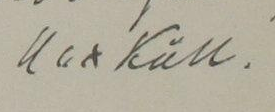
Uexküll.
